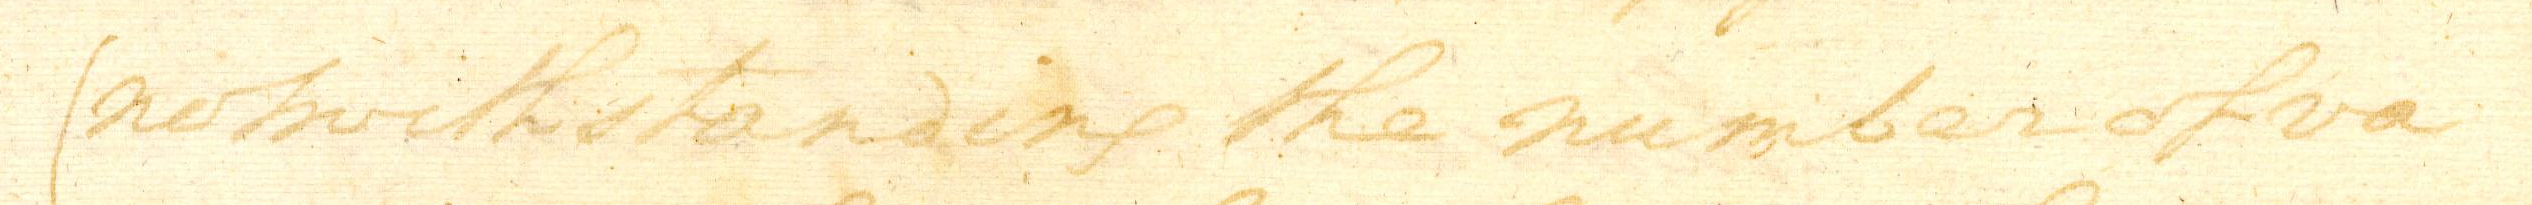(notwithstanding the number of va
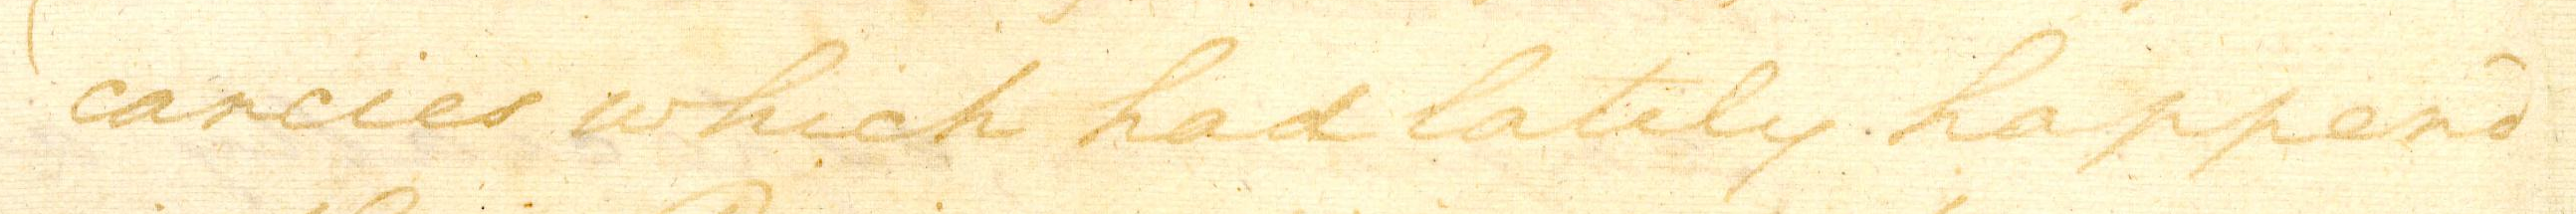cancies which had lately happend
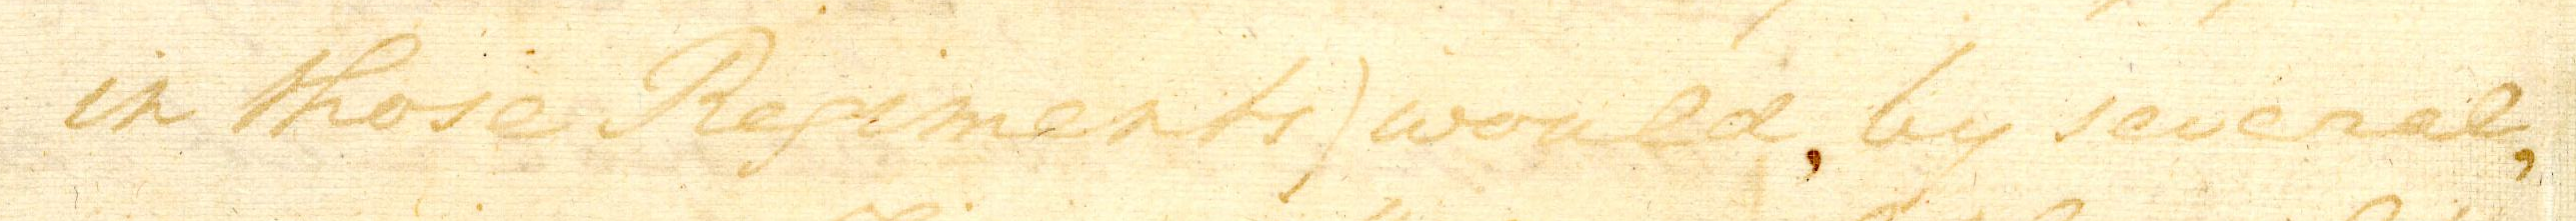in those Regiments) would, by several,
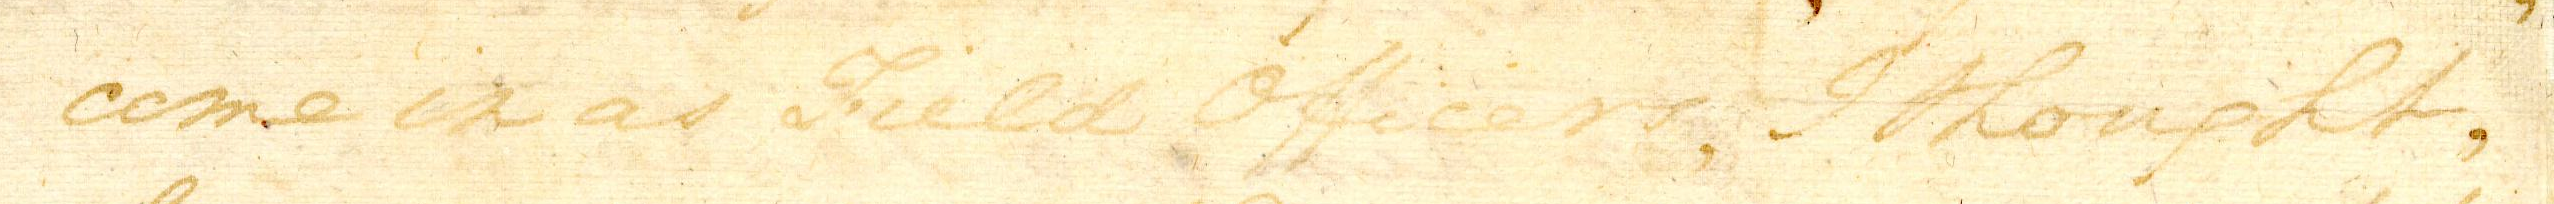come in as Field Officers, I thought,
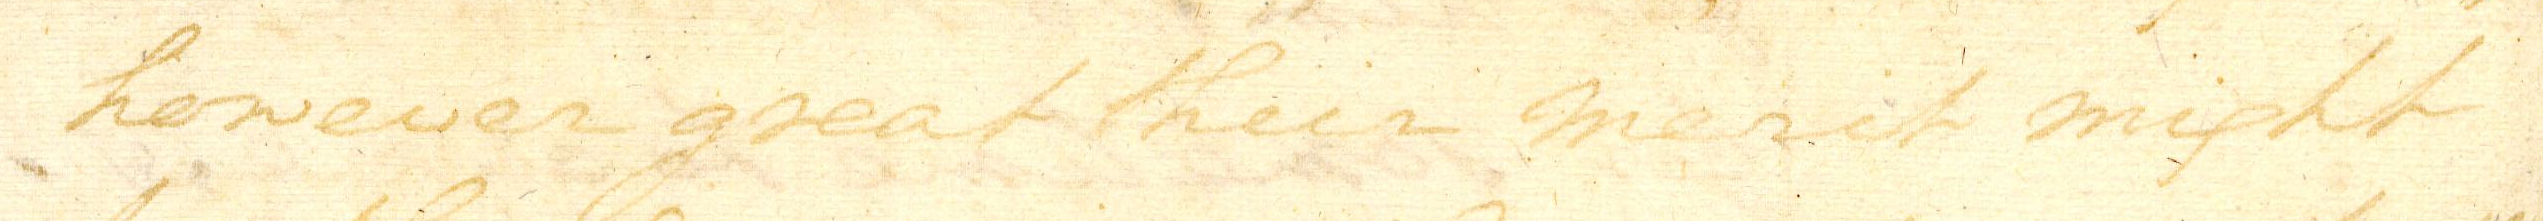however great their merit might
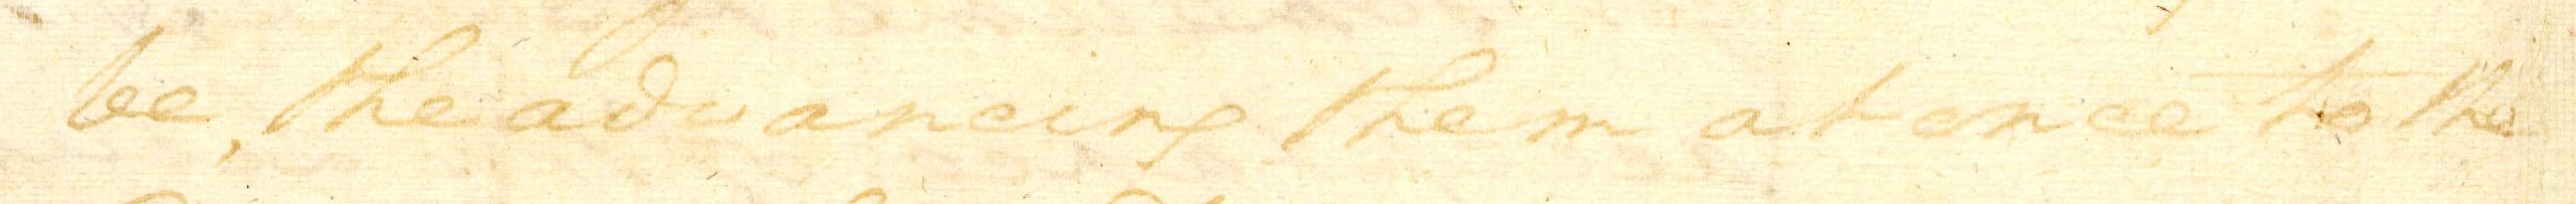be, the advancing them at once to the
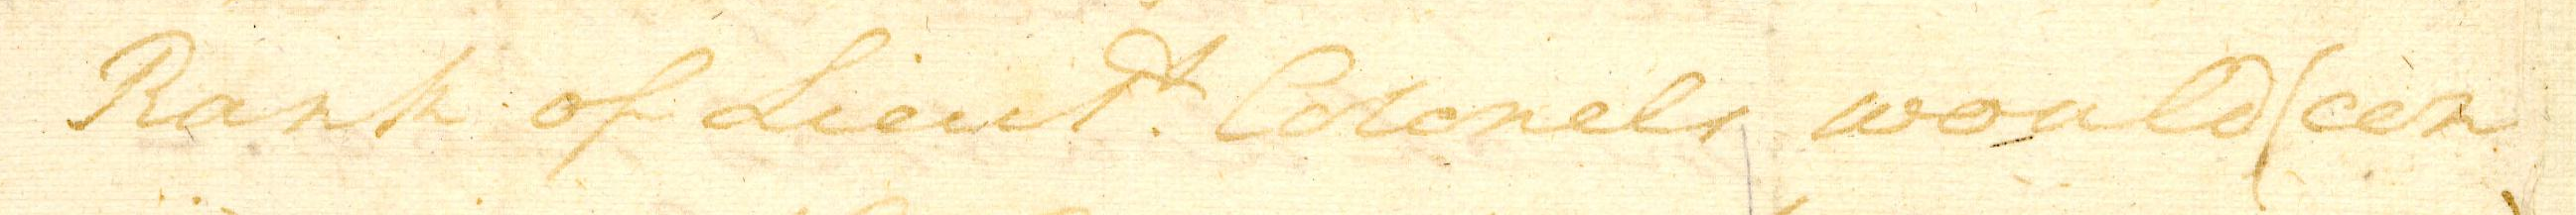Rank of Lieut^t. Colonels would (con
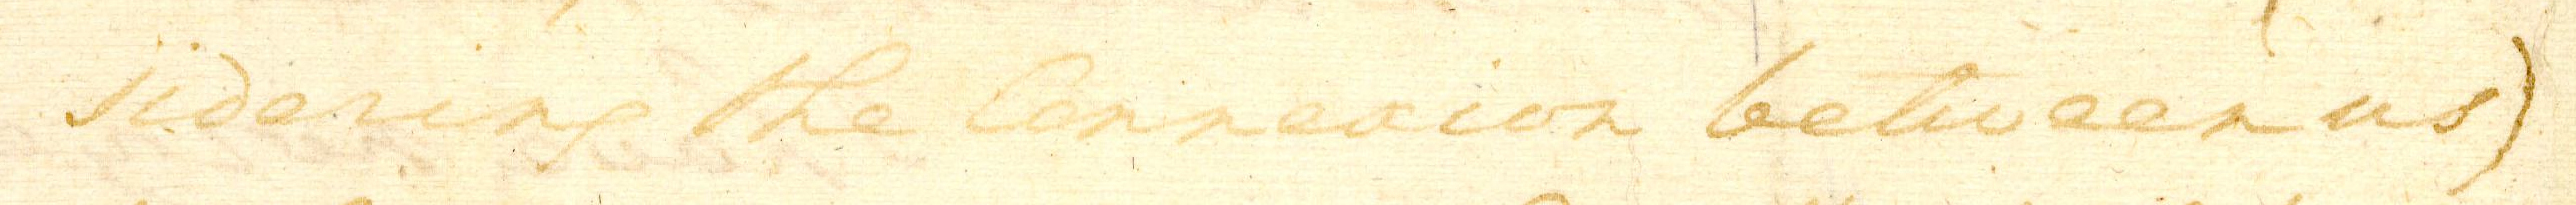sidering the Connexion between us)
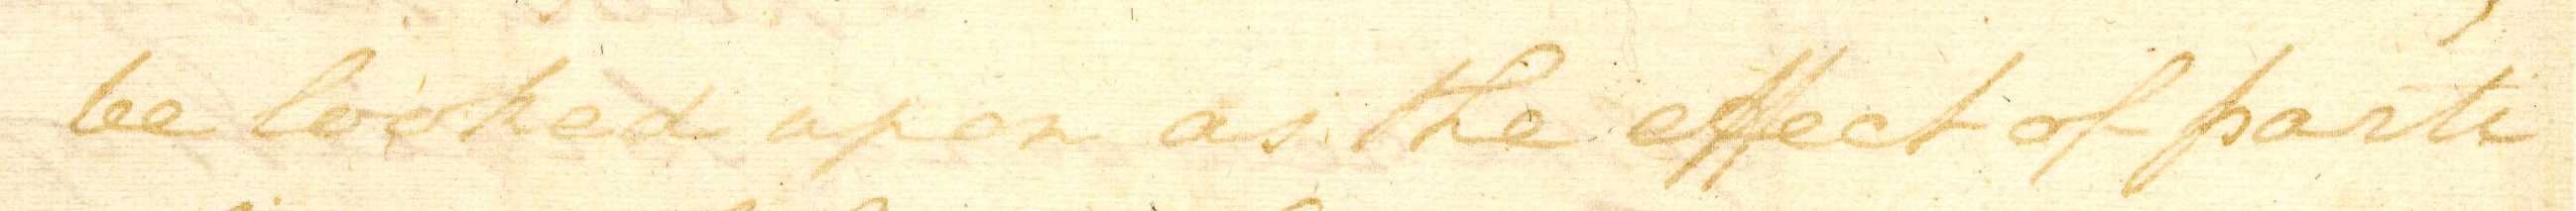be looked upon as the effect of parti
